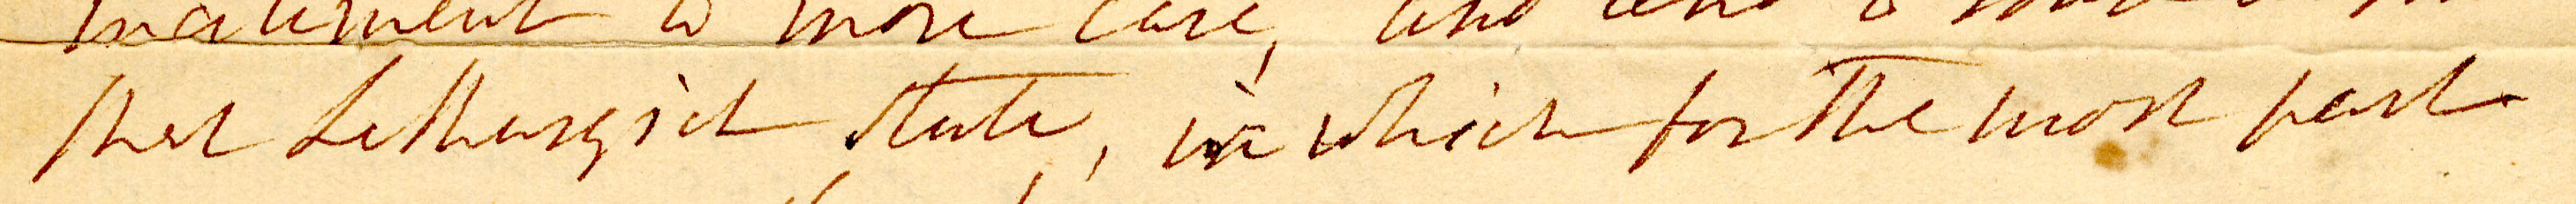that Lethargick state, in which for the most part
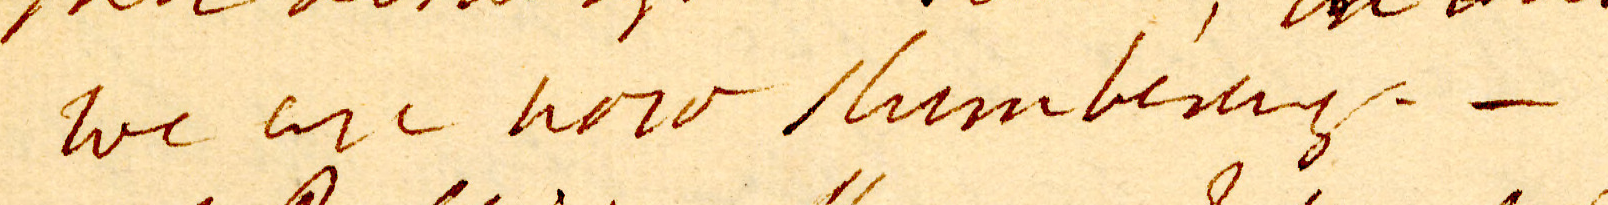we are now slumbering.-
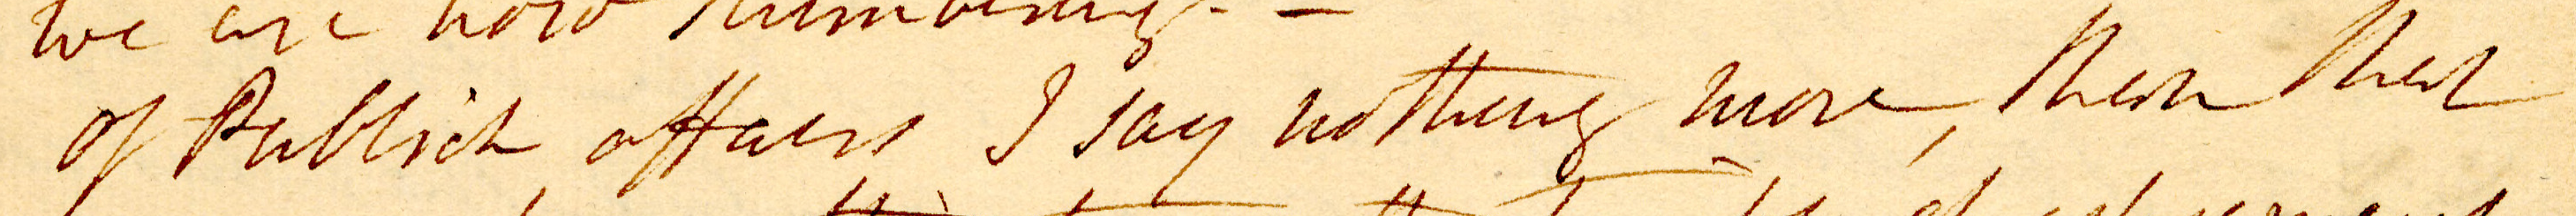of Publick affairs I say nothing more, than that
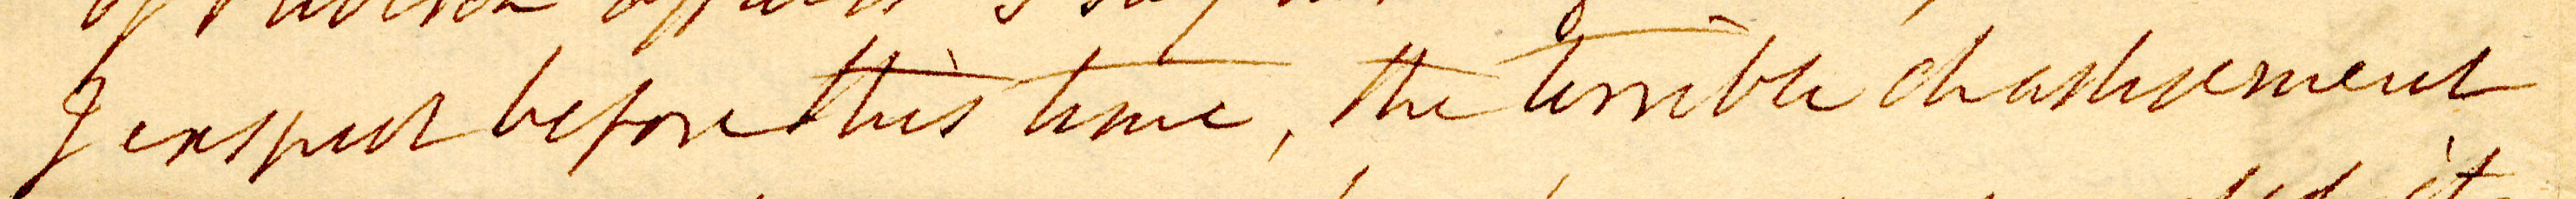I expect before this time, the terrible chastisement
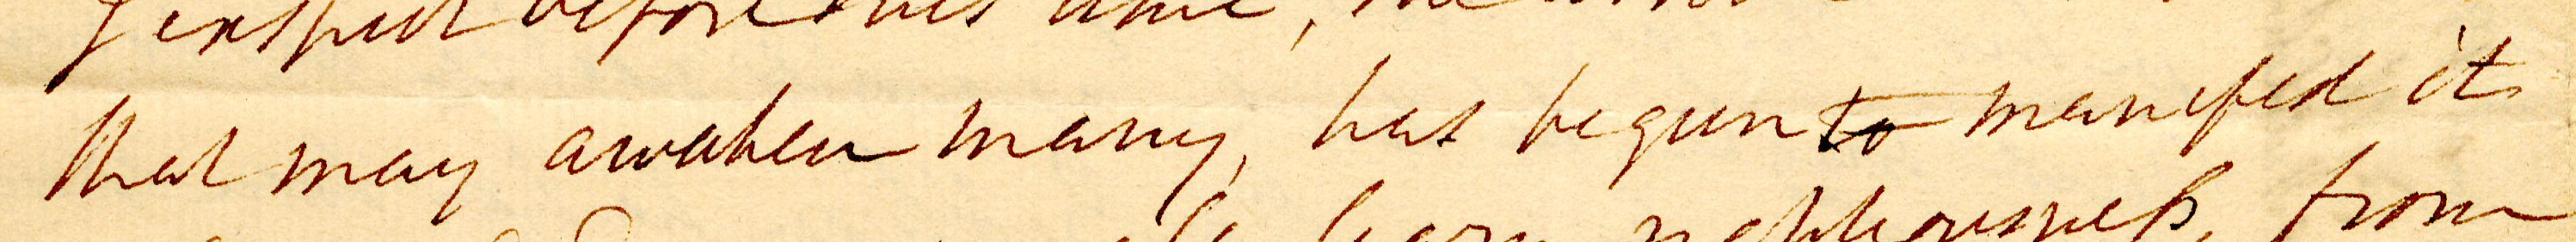that may awaken many, has begun to manifest it
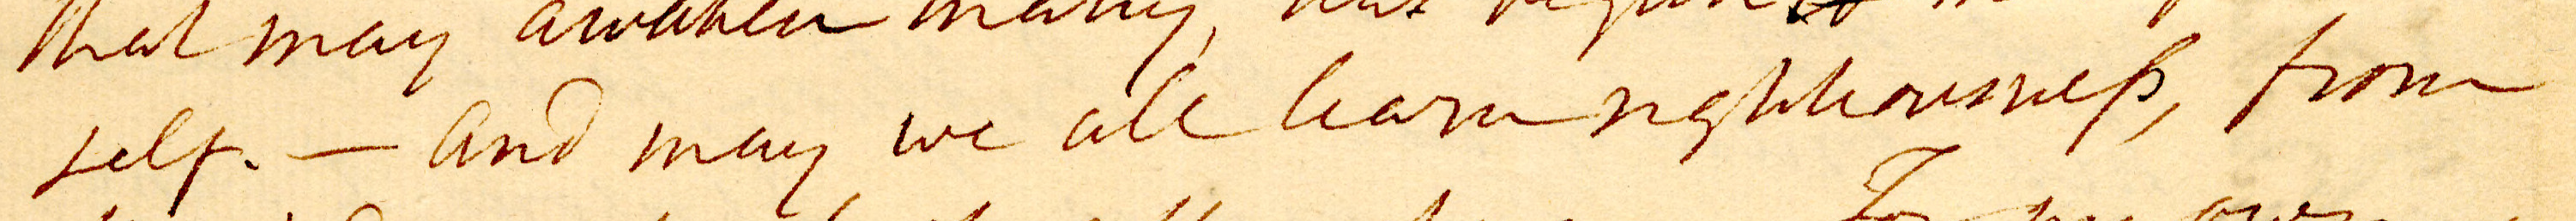self.- And may we all learn righteousness, from
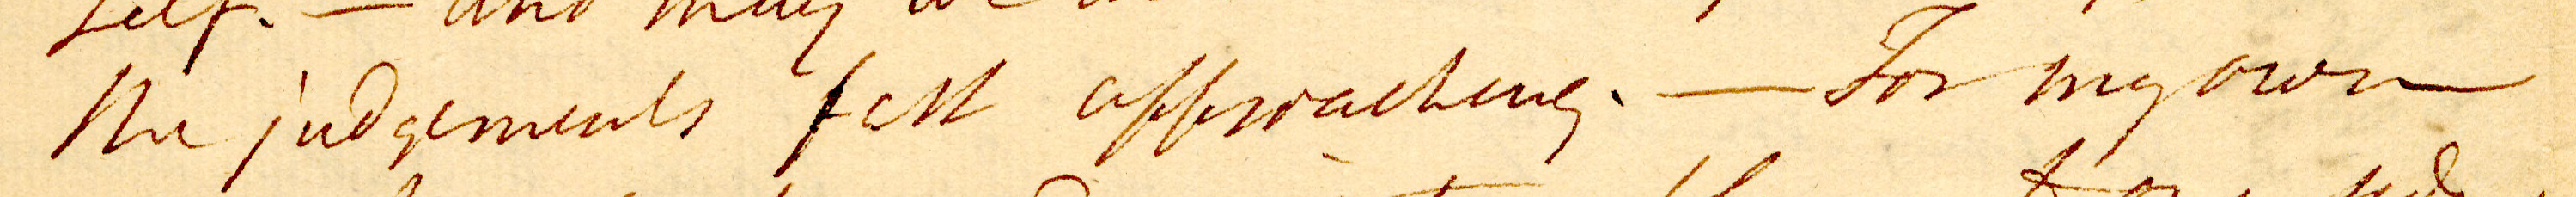the judgements fast approaching.- For my own
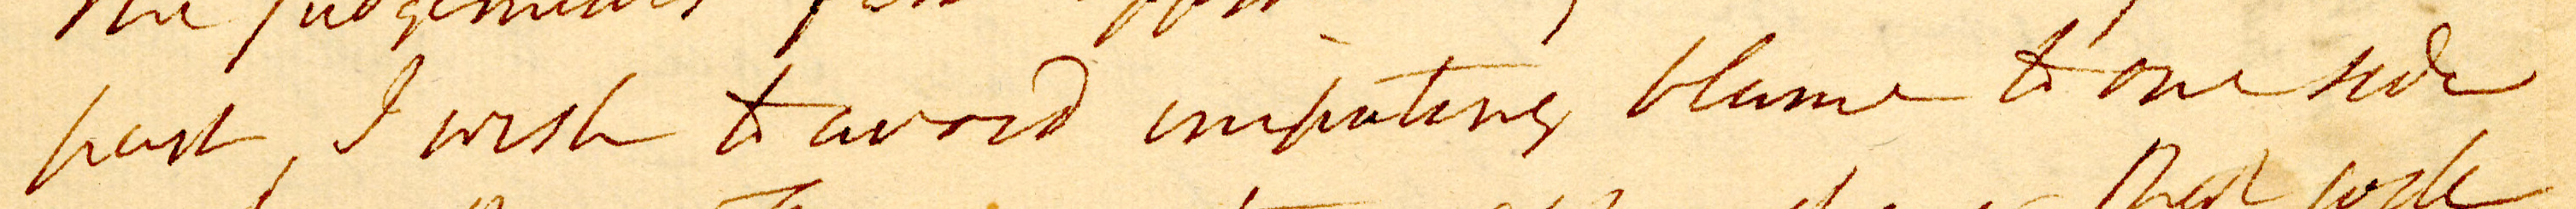part, I wish to avoid imputing blame to one side
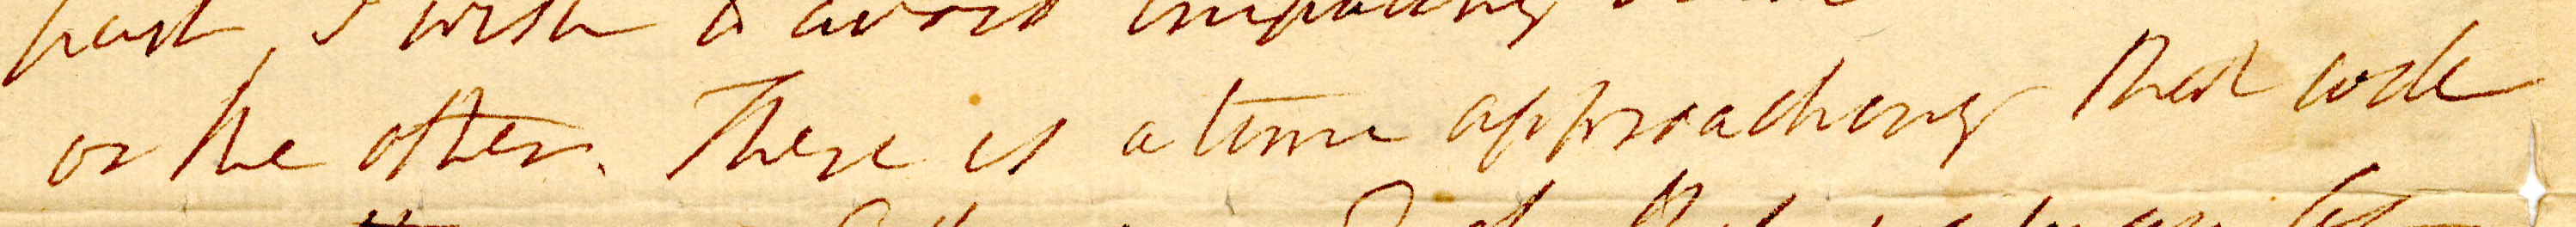or the other. There is a time approaching that will
